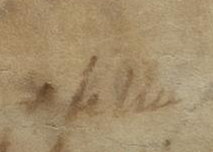A letter
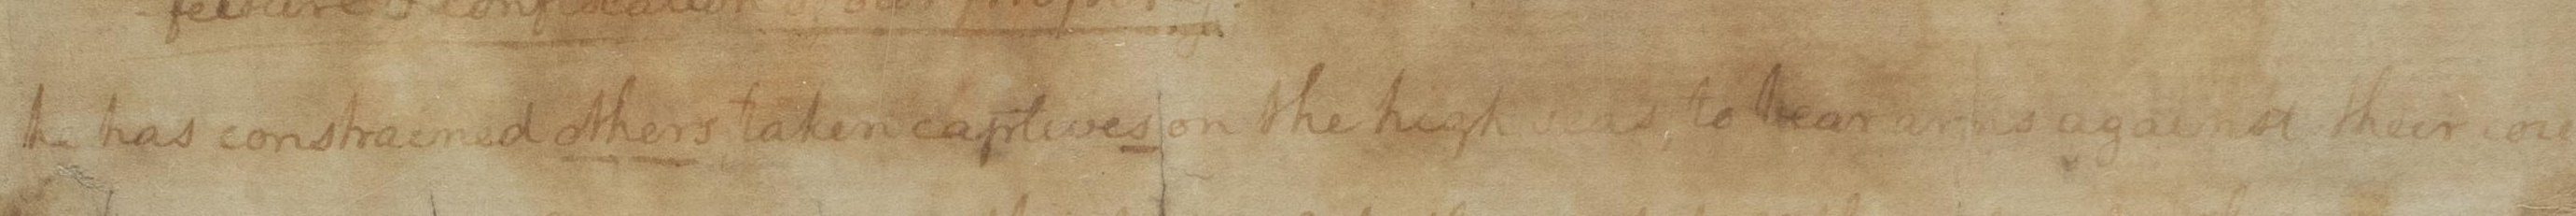He has constrained others taken captives on the high seas to bear arms against their con-
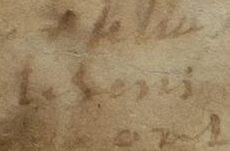be sent
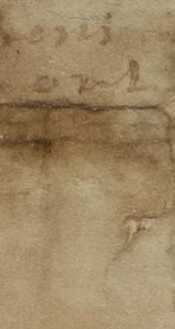out
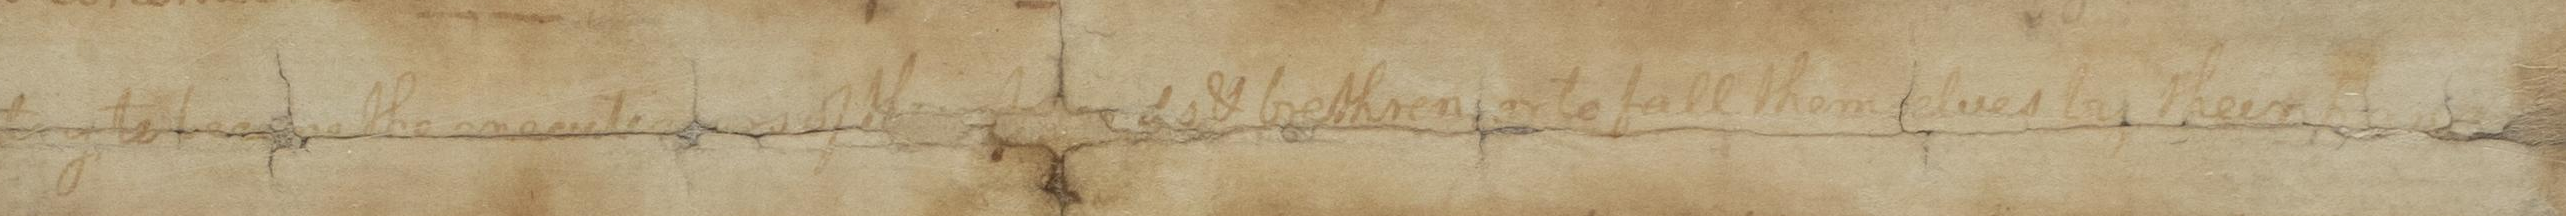-try to become the executioners of [_____] & brethren or to fall themselves by their
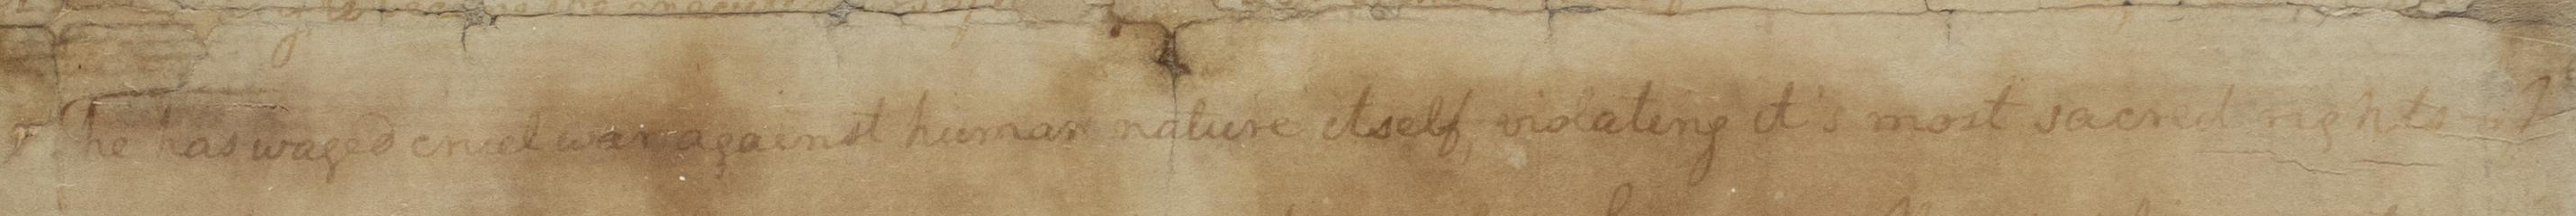He has waged cruel war against human nature itself, violating it's most sacred rights at
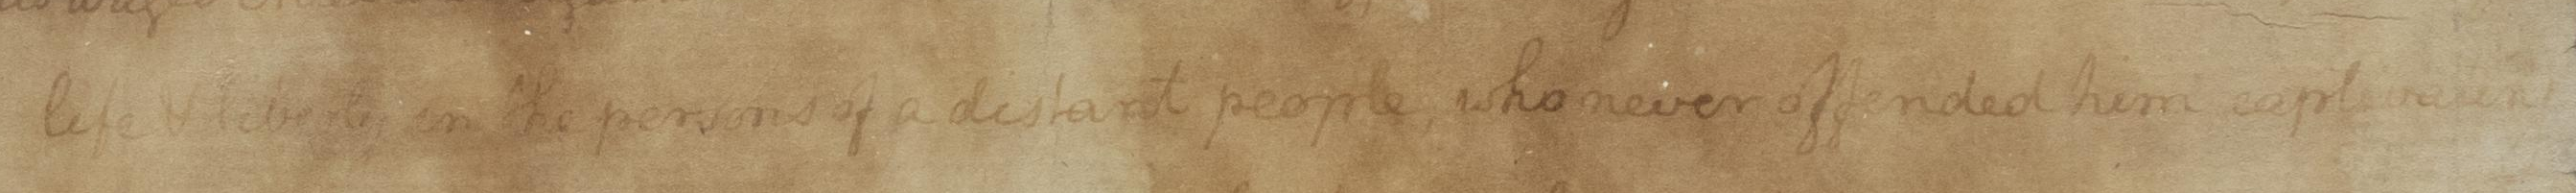life & liberty on the persons of a distant people, who never offended him complain
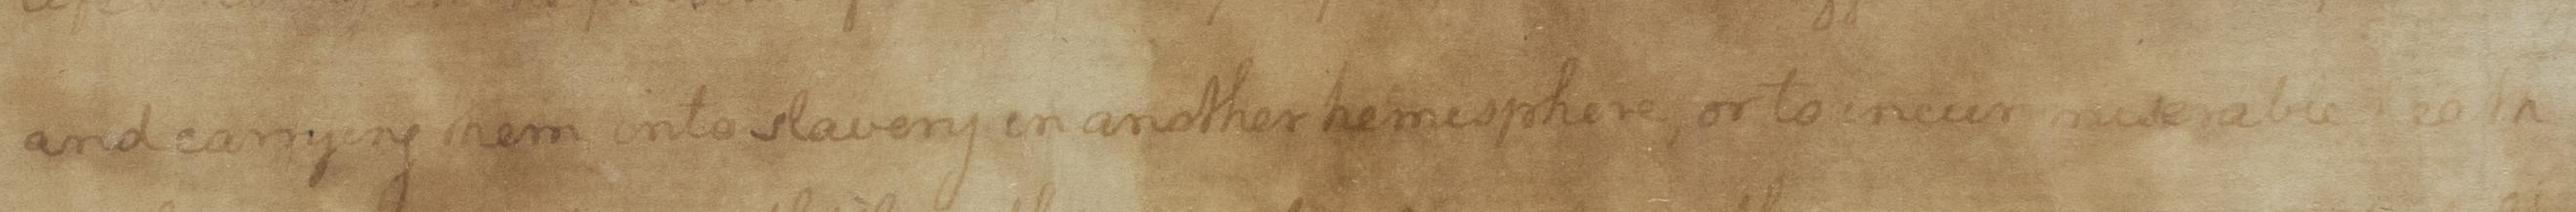and carrying them into slavery in another hemisphere, or to never make able to in
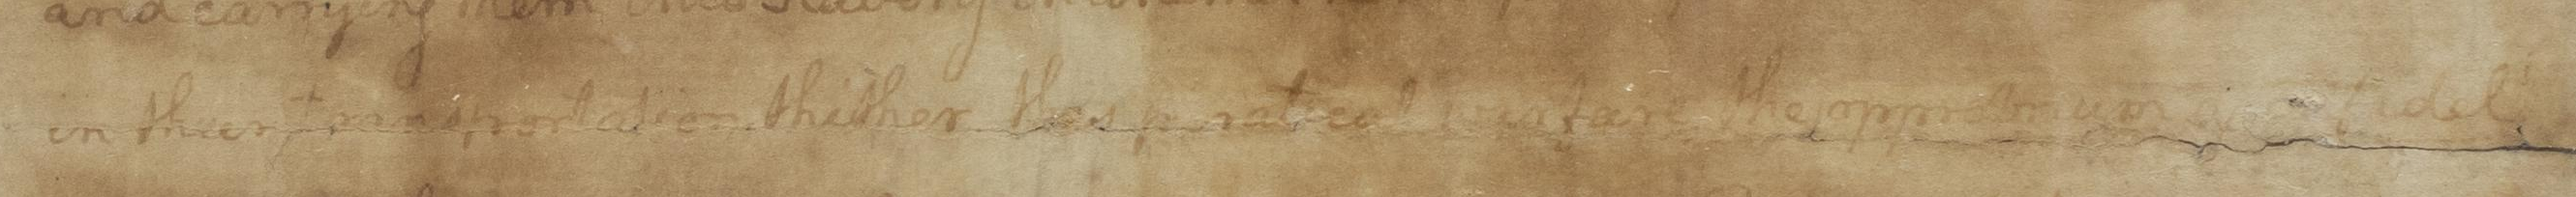in their transportation their, Has [____]ted
